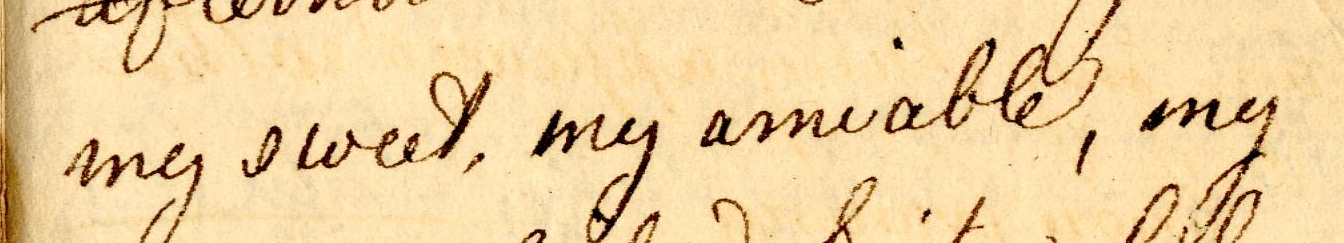my sweet, my amiable, my
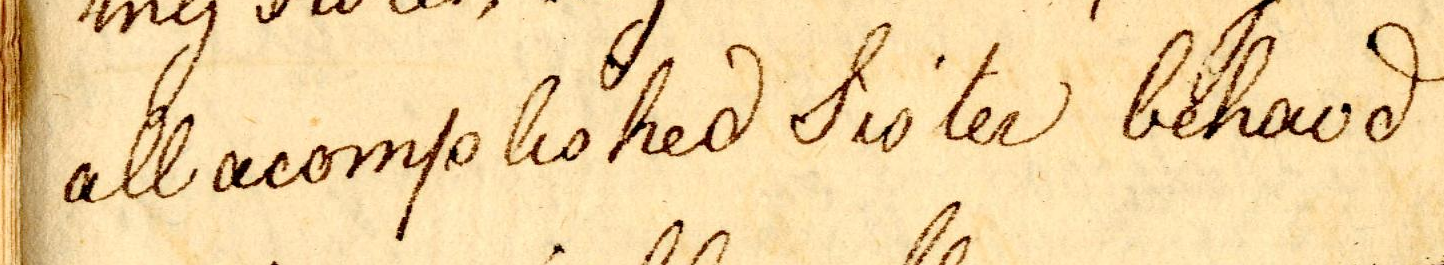all accomplished Sister behavd
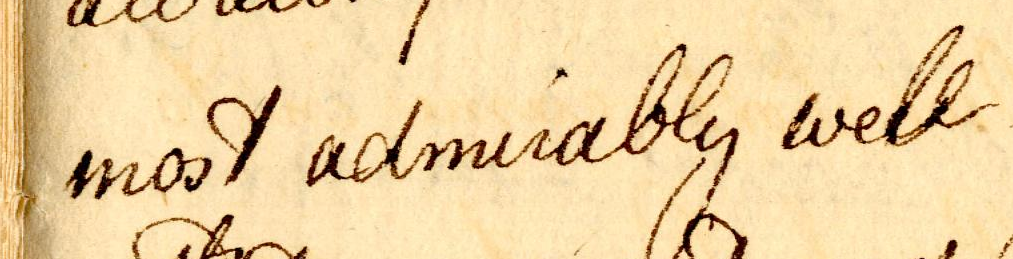most admirably well
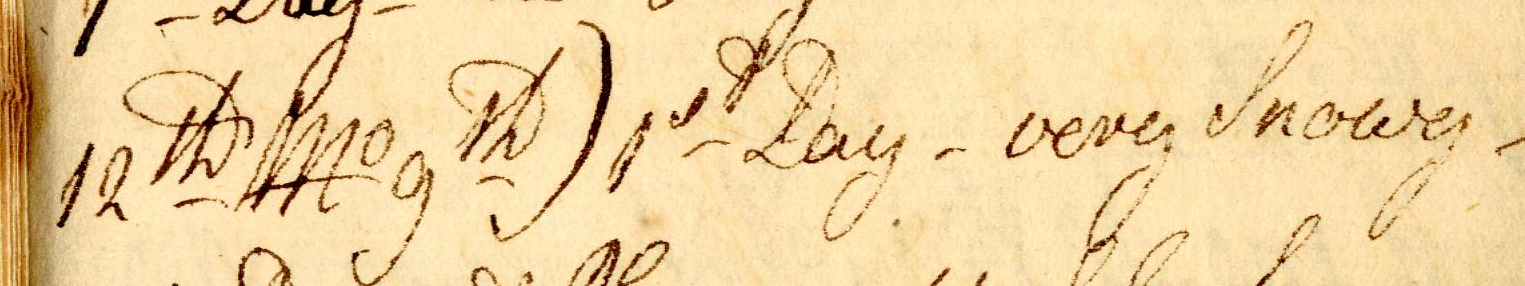12^th M^o 9^th) 1^st Day- very Snowy
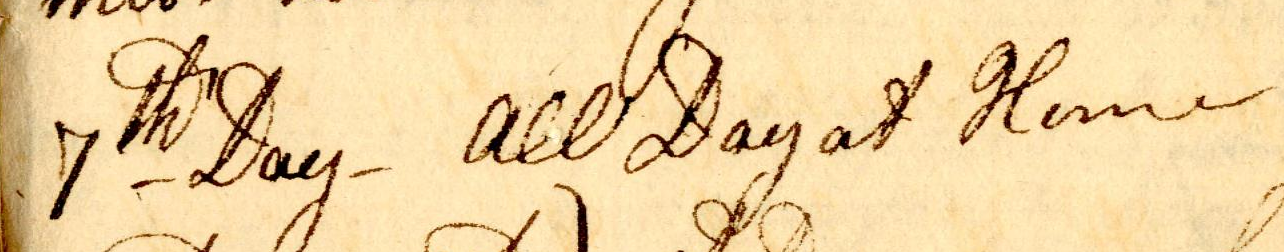7^th Day- All Day at Home
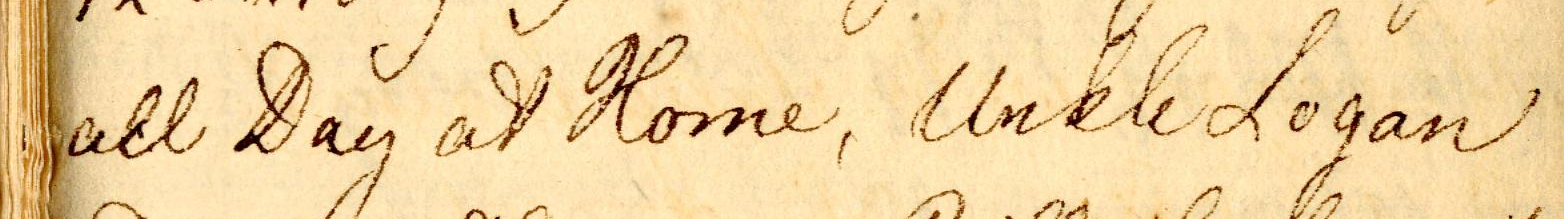all Day at Home, Unkle Logan
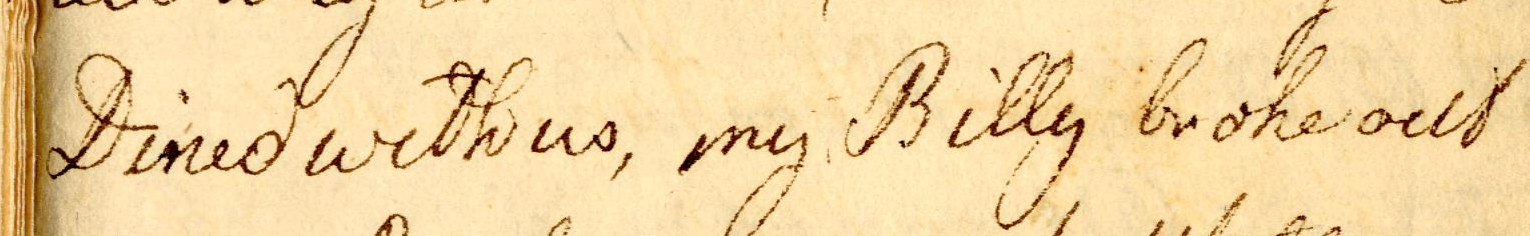Dined with us, my Billy broke out
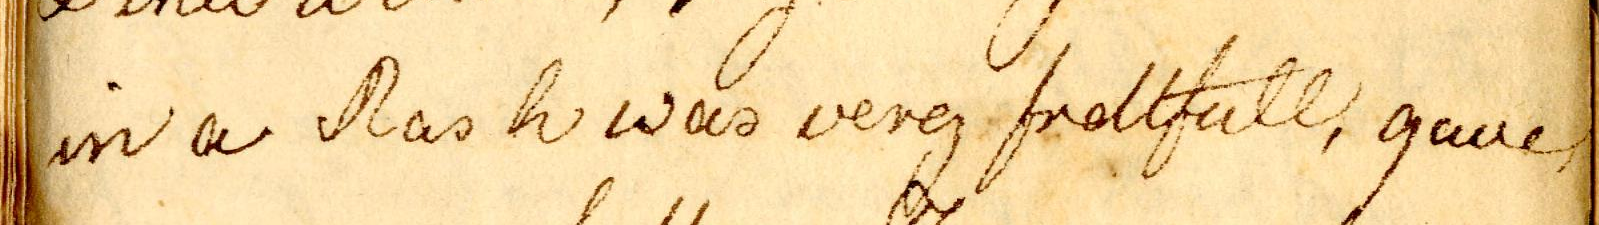in a Rash was very fretfull, gave
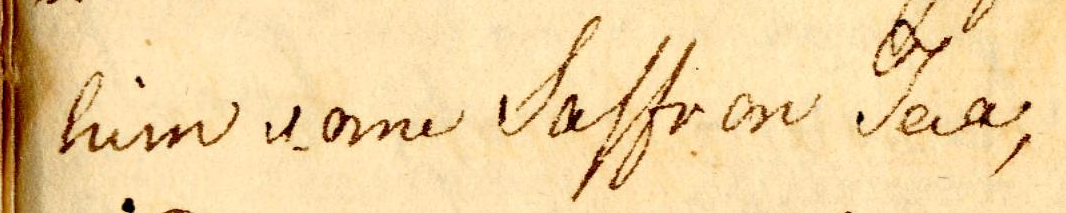him some Saffron Tea,
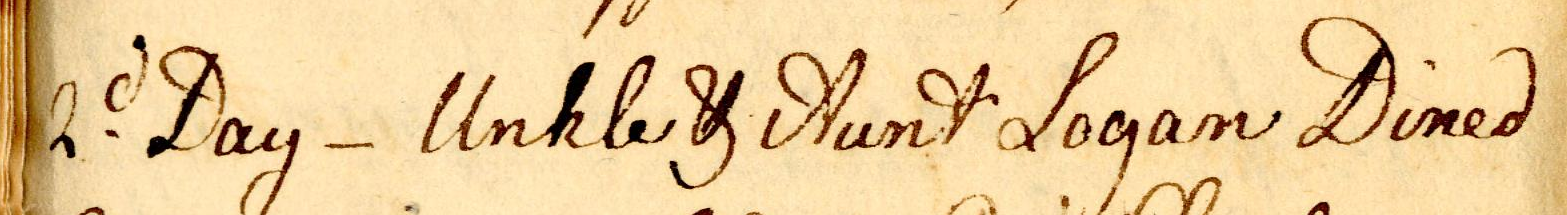2^d. Day- Unkle & Aunt Logan Dined
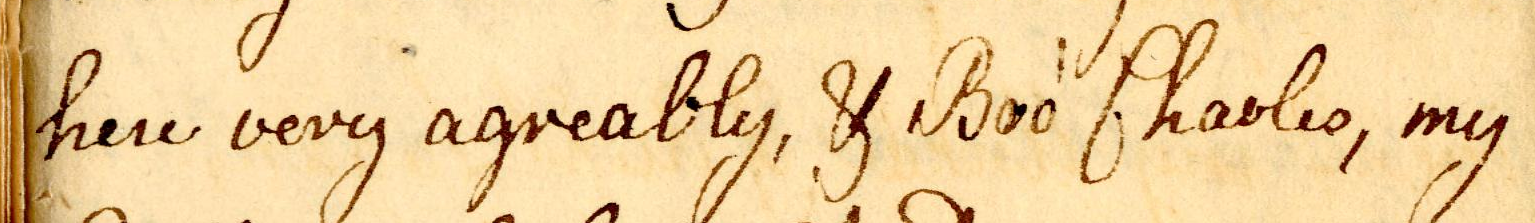here very agreably, & Bro' Charles, my
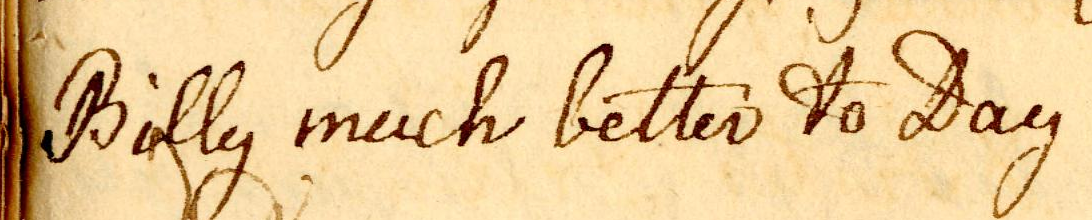Billy much better to Day
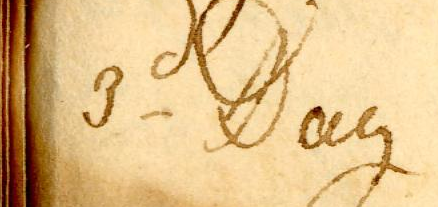3^d- Day
